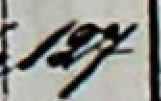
127
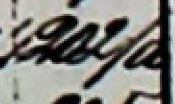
202/a
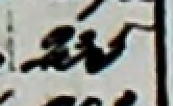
235
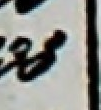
238
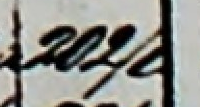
202/?
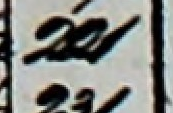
201
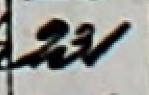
231
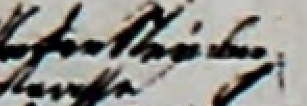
A???
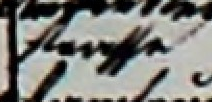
???sse
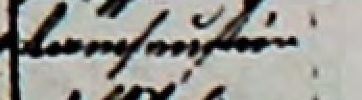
Ramsaustein
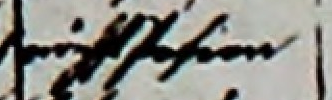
??? Posion
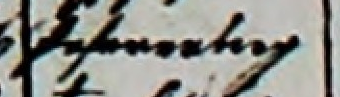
Josererberg
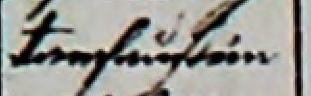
Ramsaustein
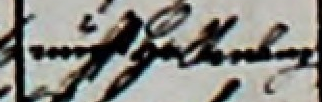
au??? Hollenberg
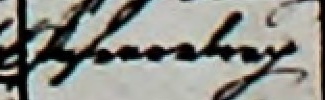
Posererberg
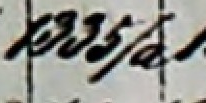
1335/a
